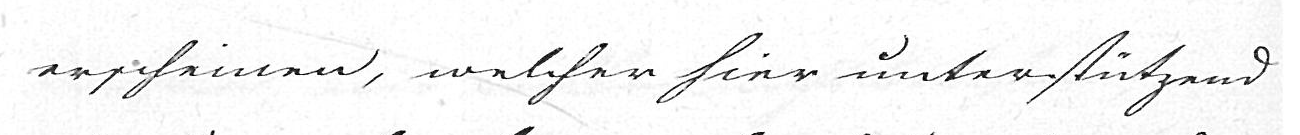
erscheinen, welcher hier unterstützend
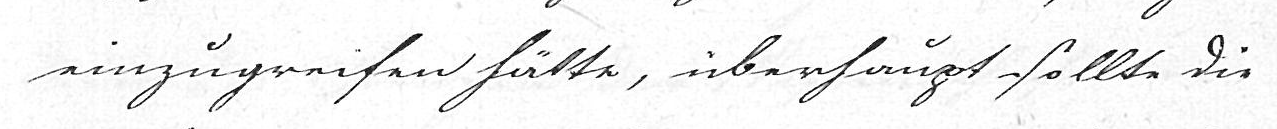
einzugreifen hätte, überhaupt sollte die
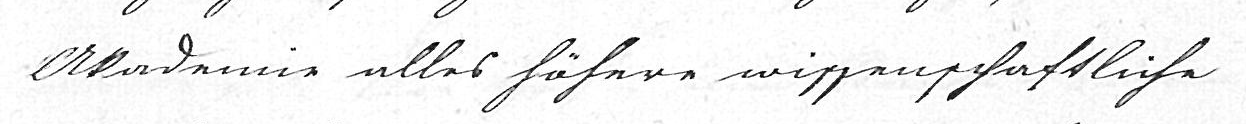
Akademie alles höhere wissenschaftliche
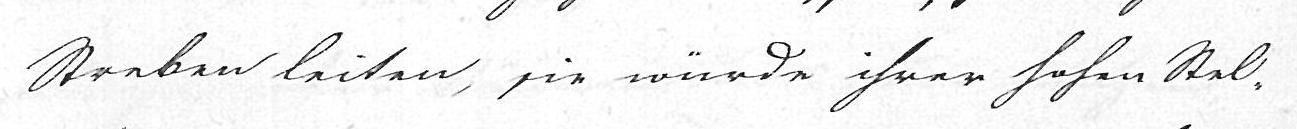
Streben leiten, sie würde ihrer hohen Stel-
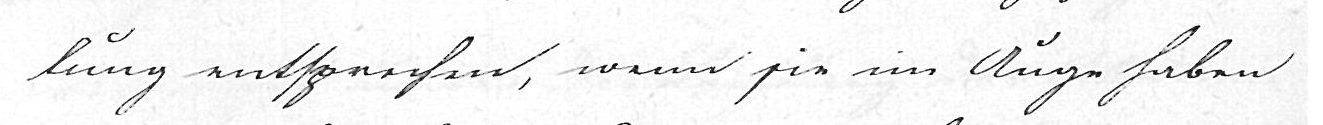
lung entsprechen, wenn sie im Auge haben
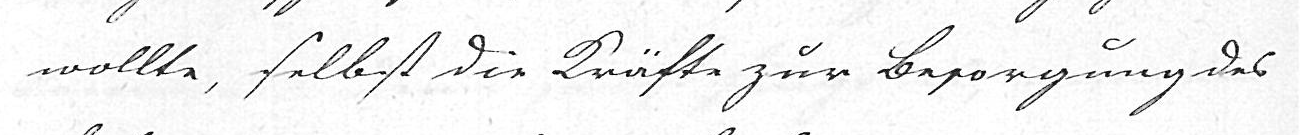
wollte, selbst die Kräfte zur Besorgung des
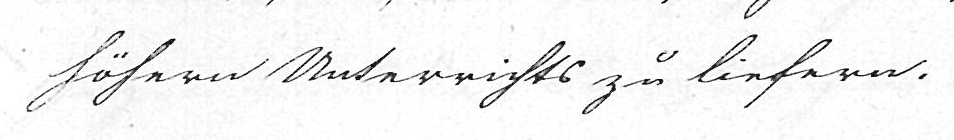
höhern Unterrichts zu liefern.
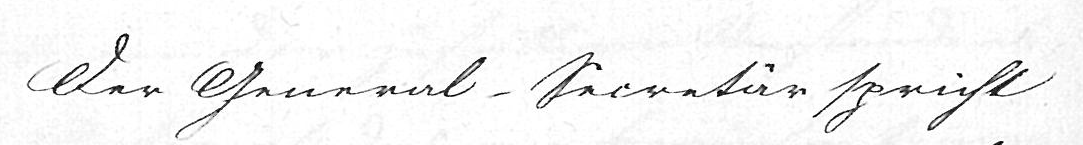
Der General-Secretär spricht
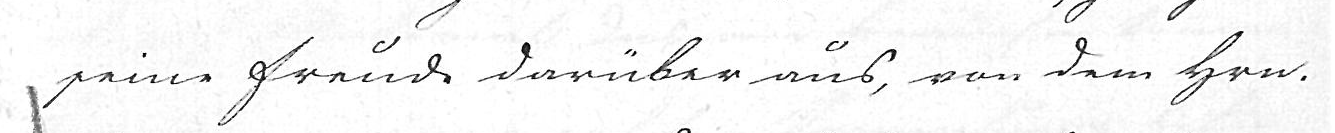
eine Freunde darüber aus, von dem Hrn.
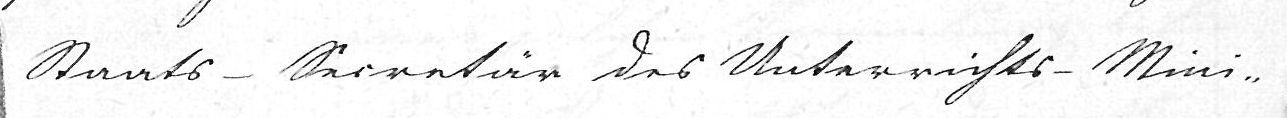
Staats-Secretär des Unterrichts-Mini-
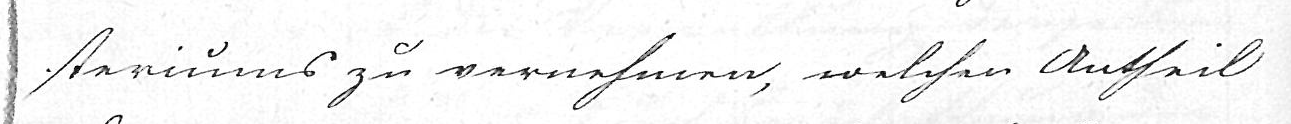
steriums zu vernehmen, welchen Antheil
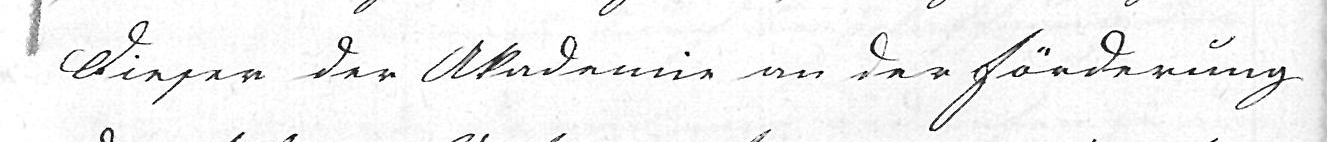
dieser der Akademie an der Förderung
